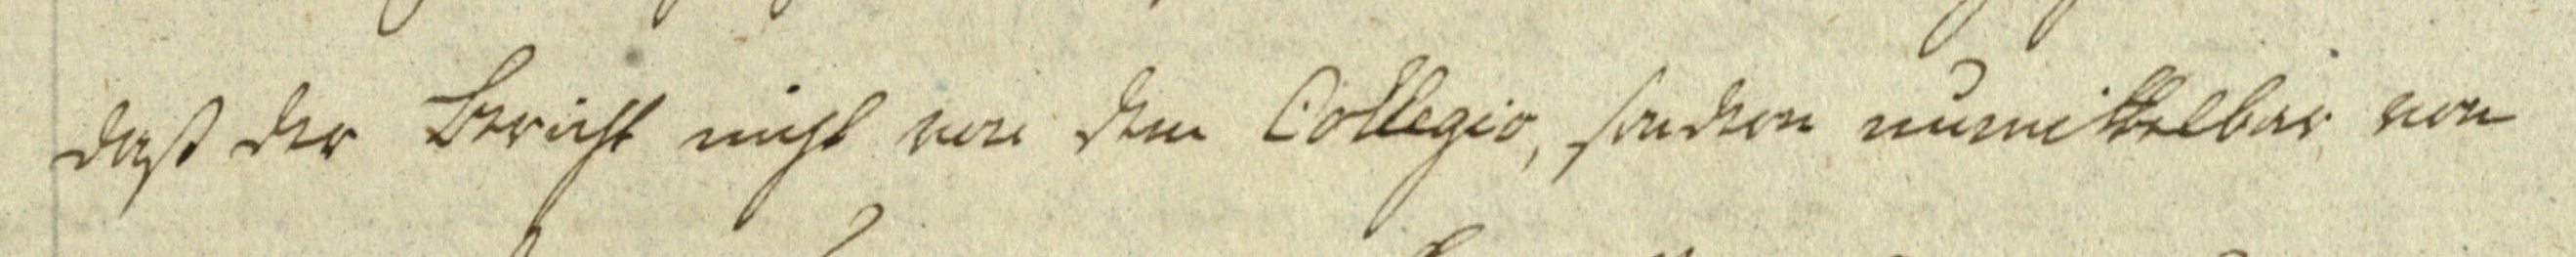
daß der Bericht nicht von dem Collegio, sondern unmittelbar von
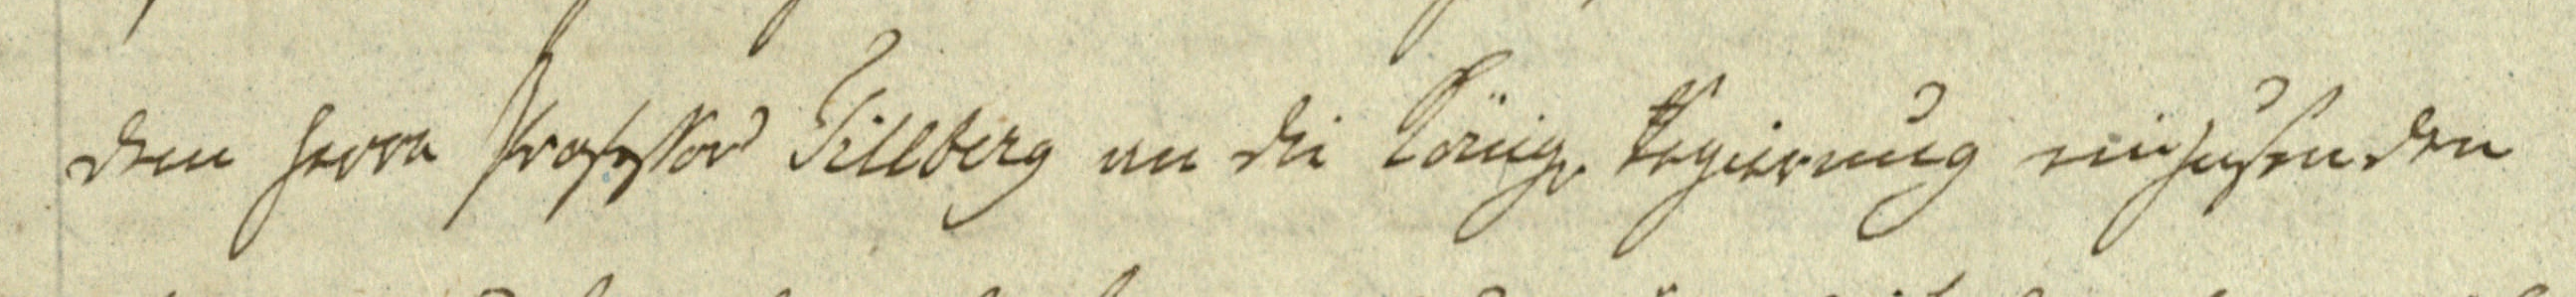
dem Herrn Professor Tillberg an die König. Regierung einzusenden
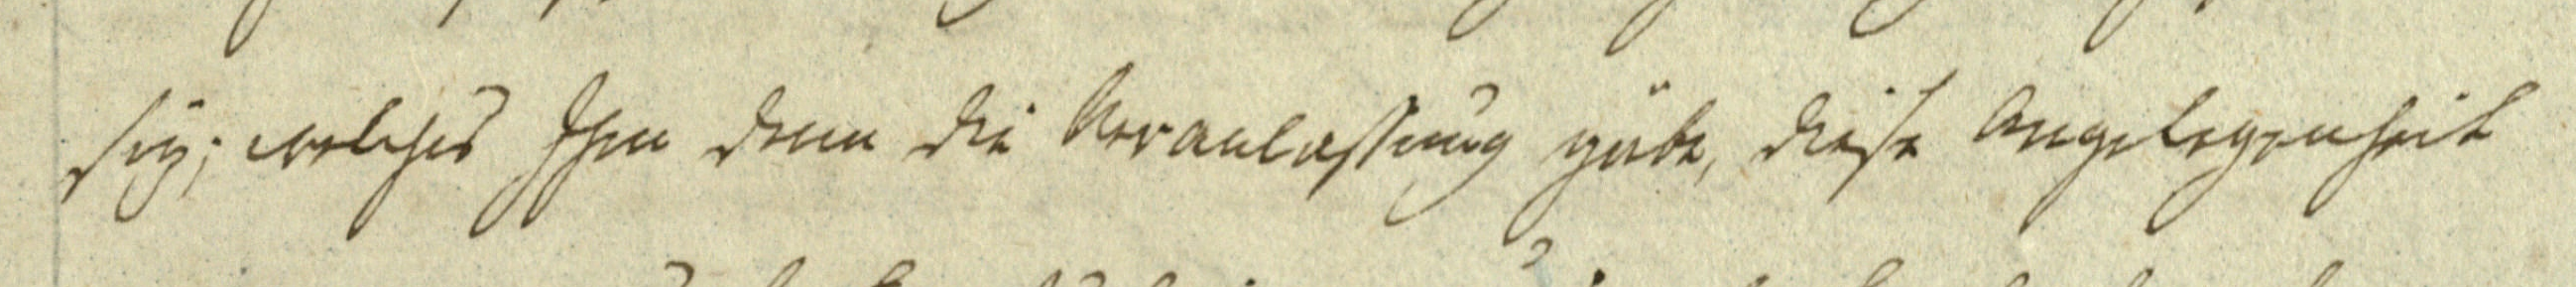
seÿ, welches Ihm denn die Veranlassung gäbe, diese Angelegenheit
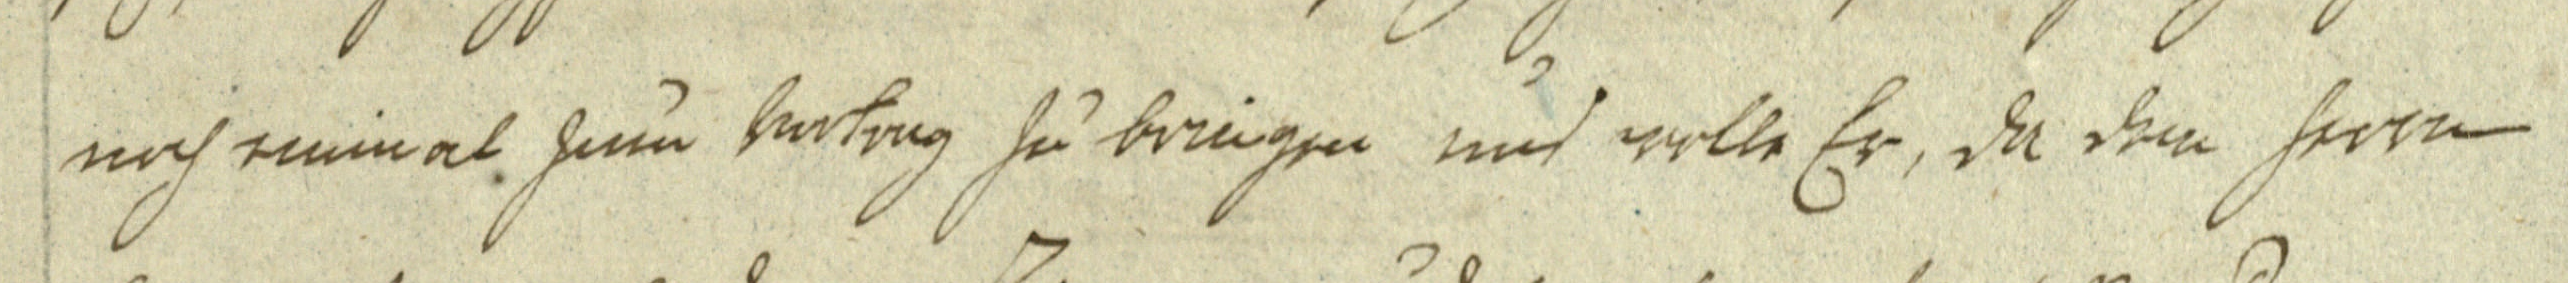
noch einmal zum Vortrag zu bringen und wolle Er, da dem Herrn
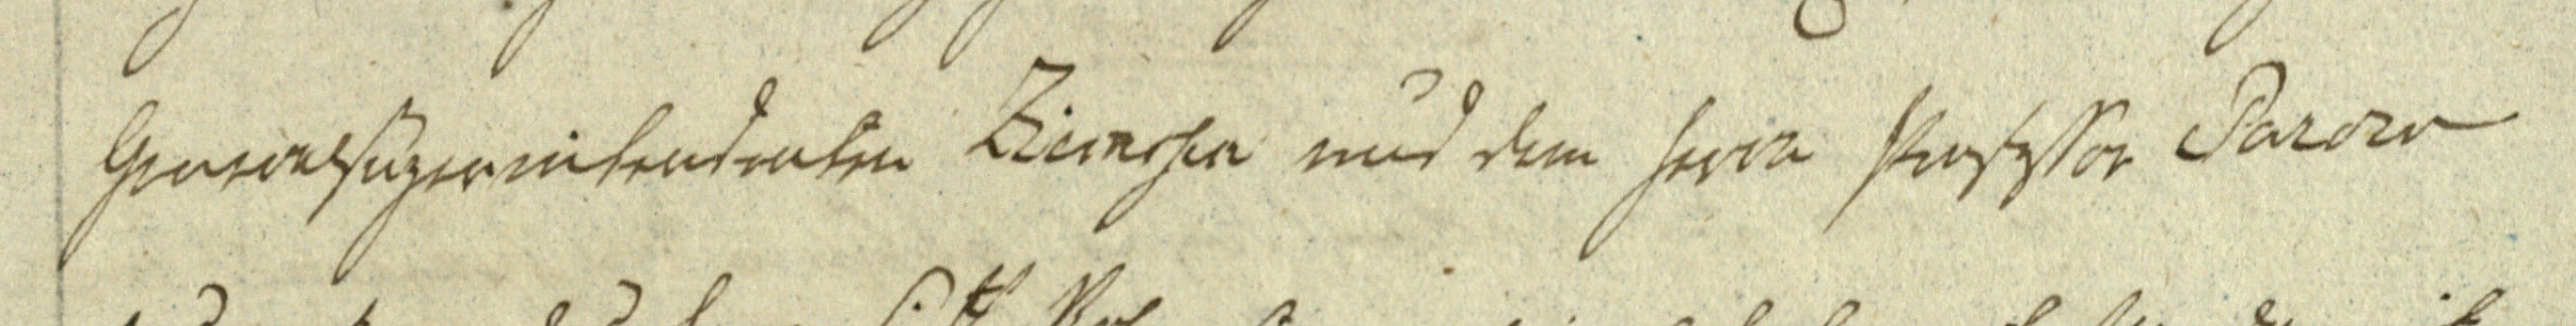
Generalsuperintendenten Ziemssen und dem Herrn Professor Parow
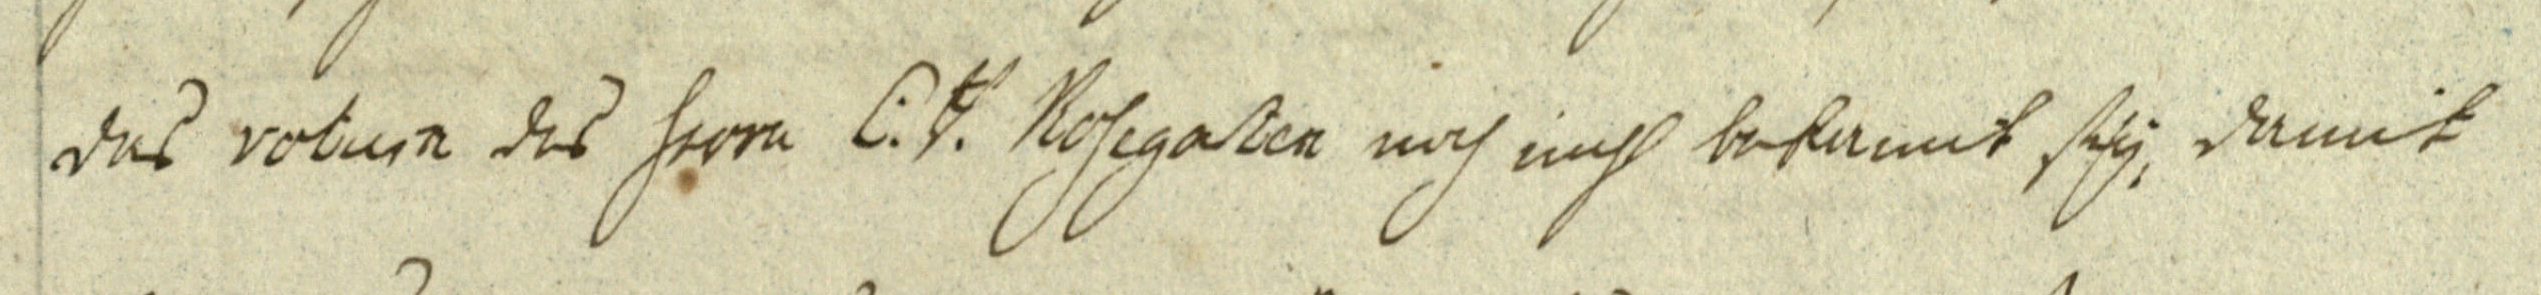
das votum des Herrn C. R. Kosegarten noch nicht bekannt seÿ, damit
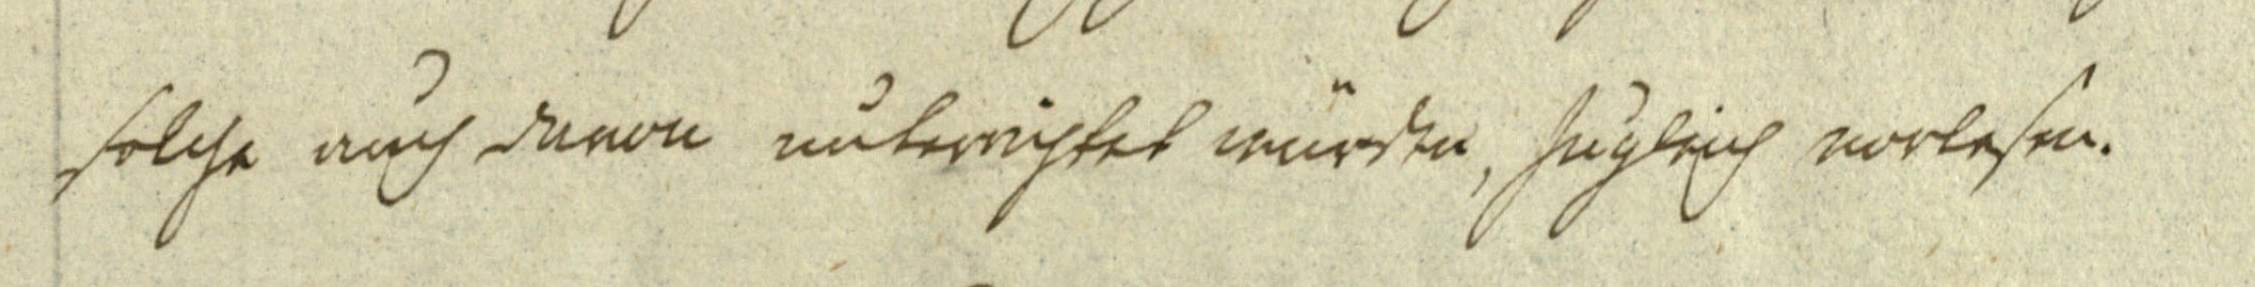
solche auch davon unterrichtet würden, zugleich vorlesen.
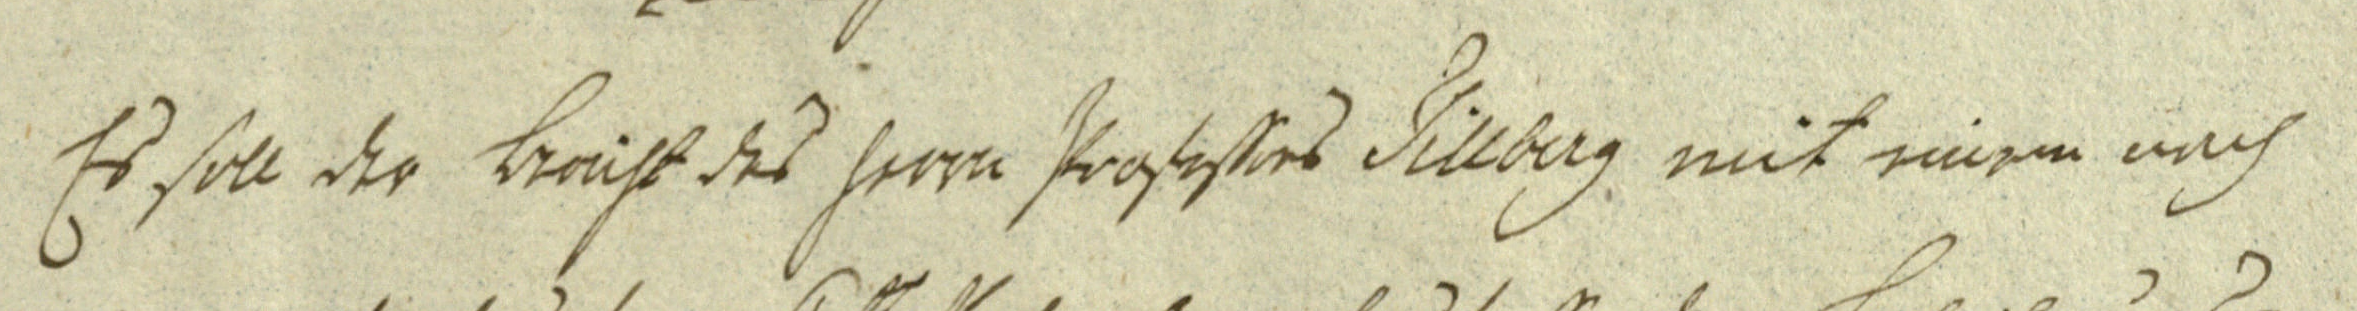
Er soll der Bericht des Herrn Professors Tillberg mit einem nach
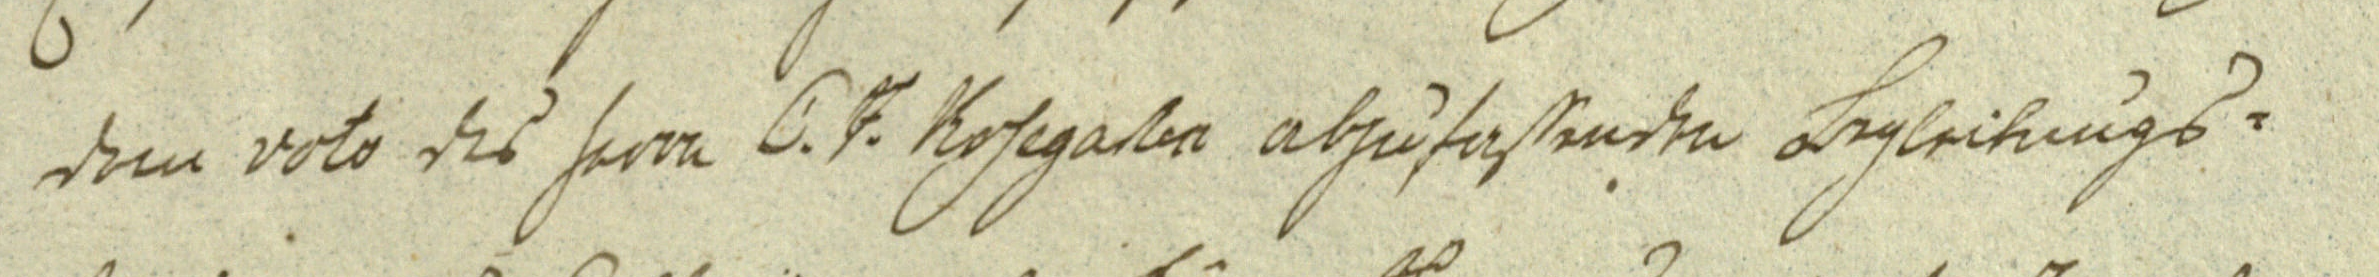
dem voto des Herrn C. R. Kosegarten abzufassenden Begleitungs¬
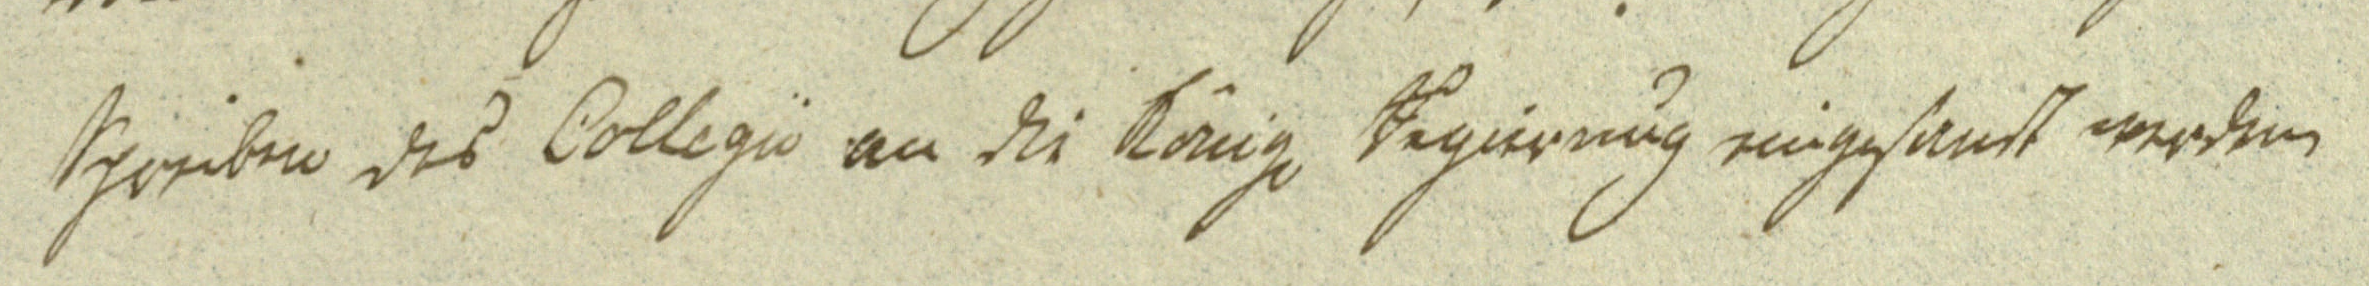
Schreiben des Collegi an die König. Regierung eingesandt werden,
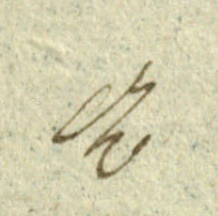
dh
